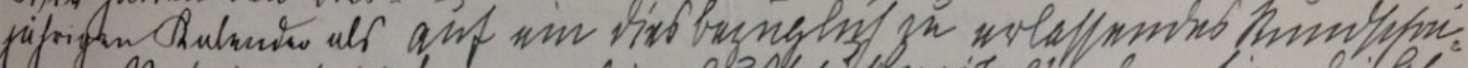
auf ein diesbezüglich zu erlassenes Rundschrei
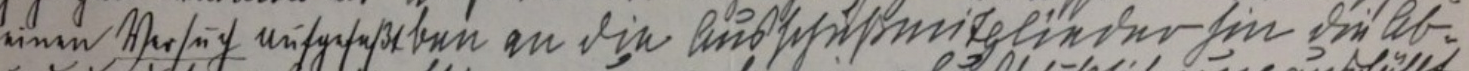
ben an die Ausschußmitglieder die An
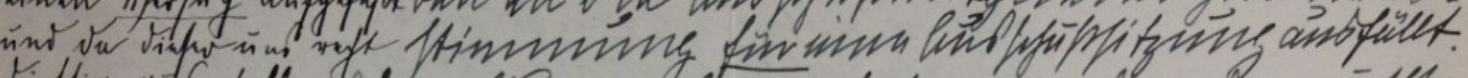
stimmung für eine Ausschußsitzung ausfällt.
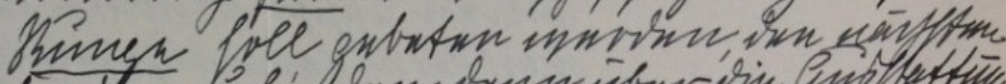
Runge soll gebeten werden den nächsten
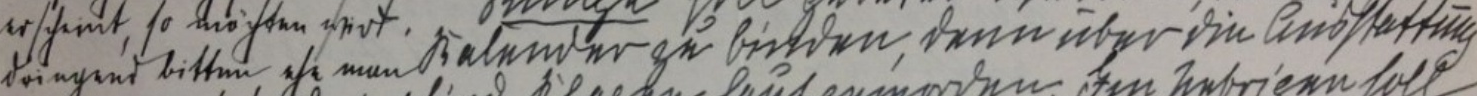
Kalender zu binden, dann über die Ausstellung
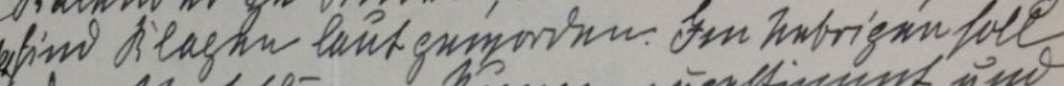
sind klagen laut geworden. Im übrigen soll
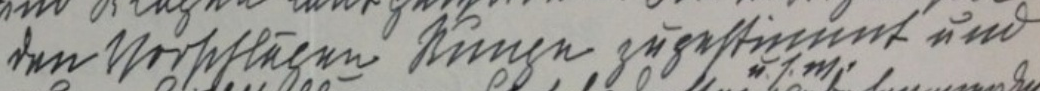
den Vorschlägen Runge zustimmt und
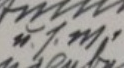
u.f.m.
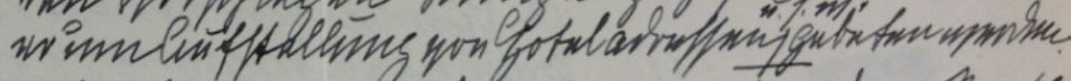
er um Aufstellung von Hoteladressen gebeten werden.
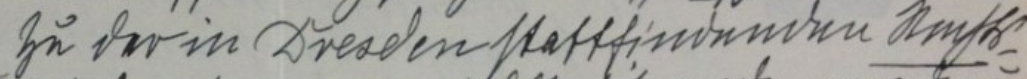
Zu der in Dresden stattfindenden Rechts
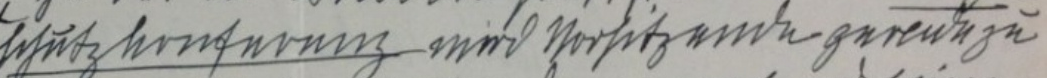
schutzkonferenz wird Vorsitzende gerade zu
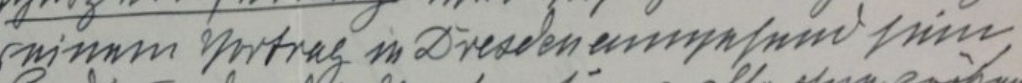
einem Vortag in Dresden anwesend sein
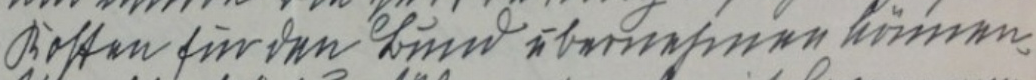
Kosten für den Bund übernehmen können.
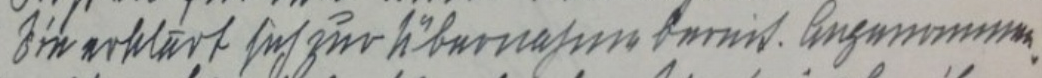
Sie erklärt sich zur Übernahme bereit. Angenommen.
